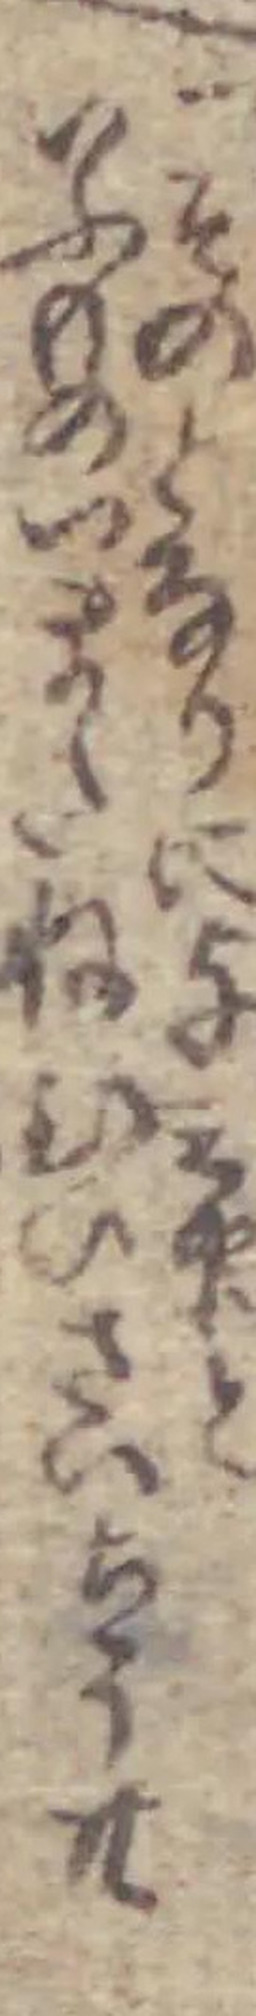いふものいまたねむいさいちう廿
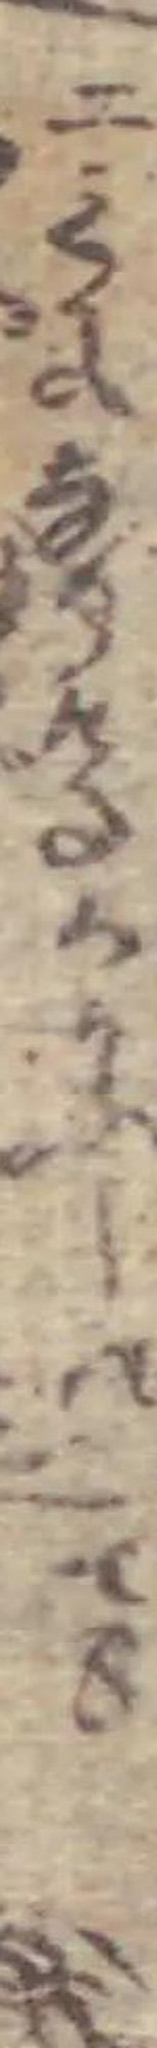二三になりけるかかふしんても
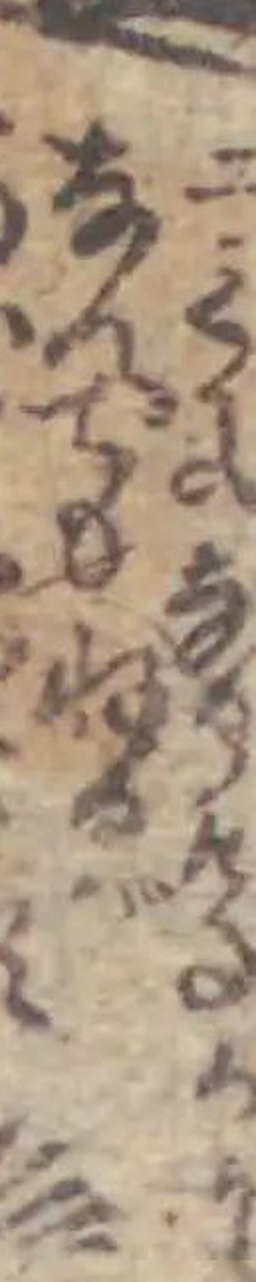なんでもねるが
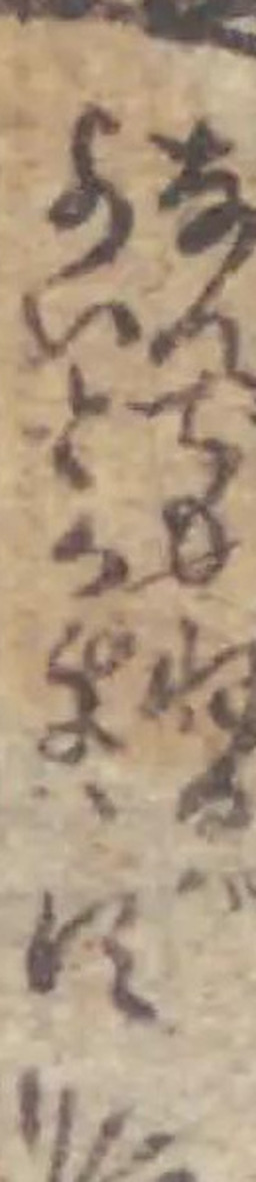よいとかかまはす
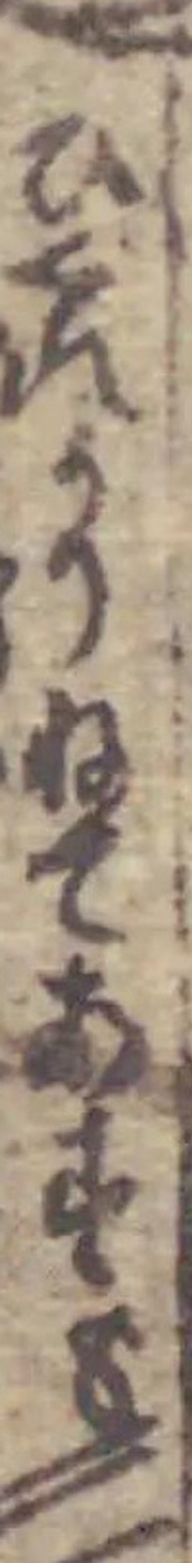ひくれよりねてあすも
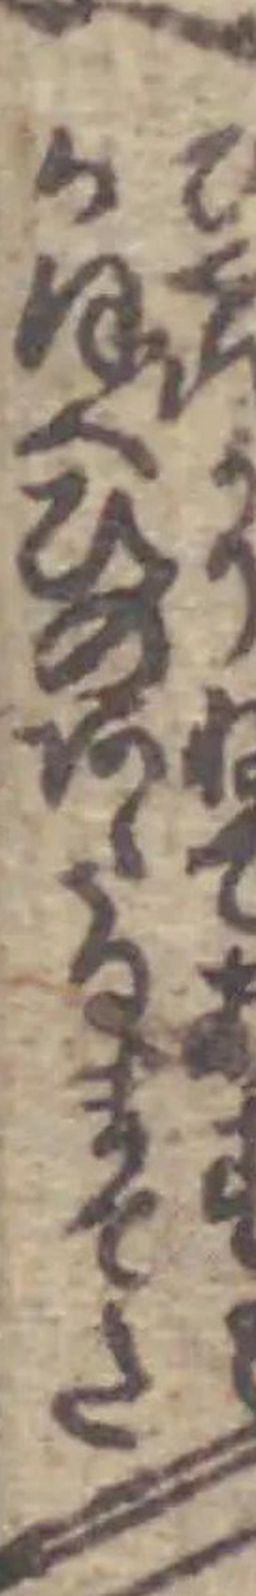かほへひのあたるまてた

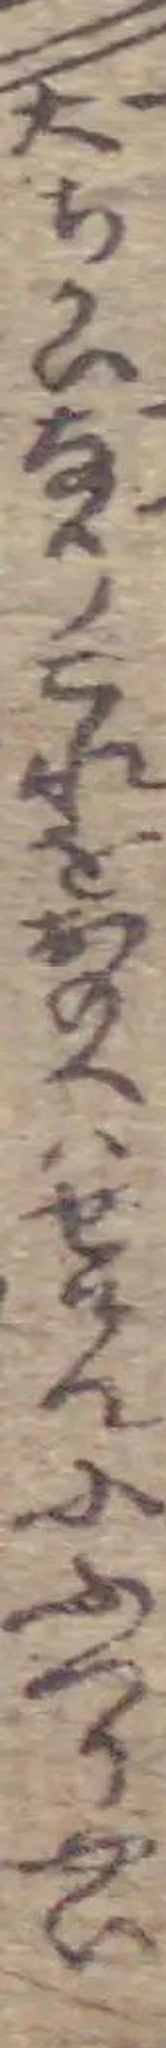大ちかいなりこれをおもへはせけんにふつりやい
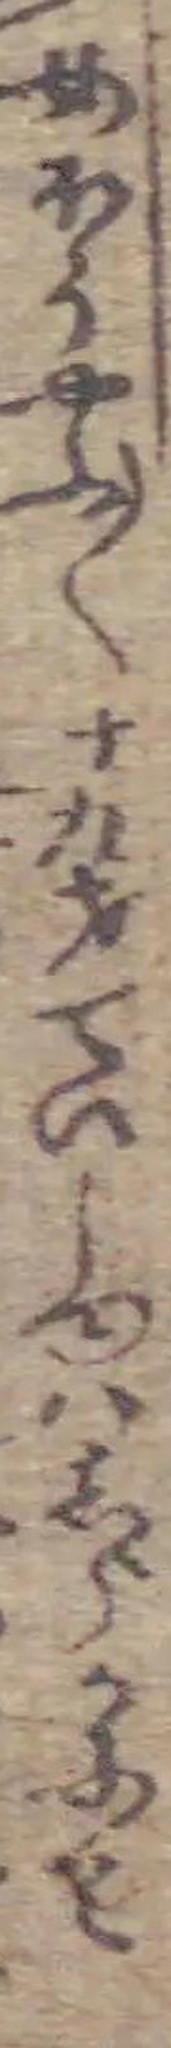女ほうやふ〳〵十九才ていしゆはしらがにて
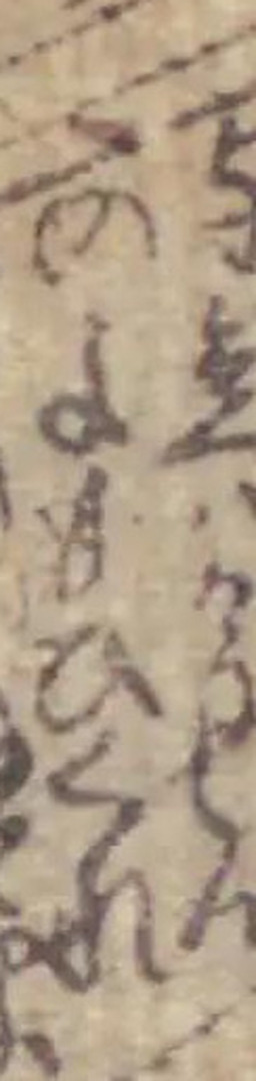のよもひくれ
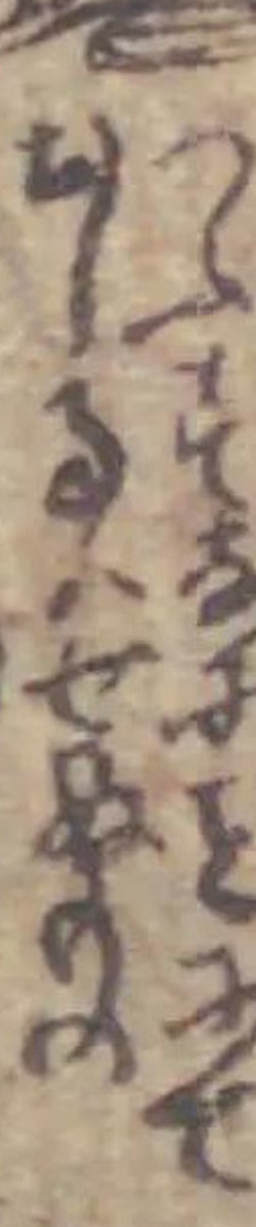おし事はせぬもの
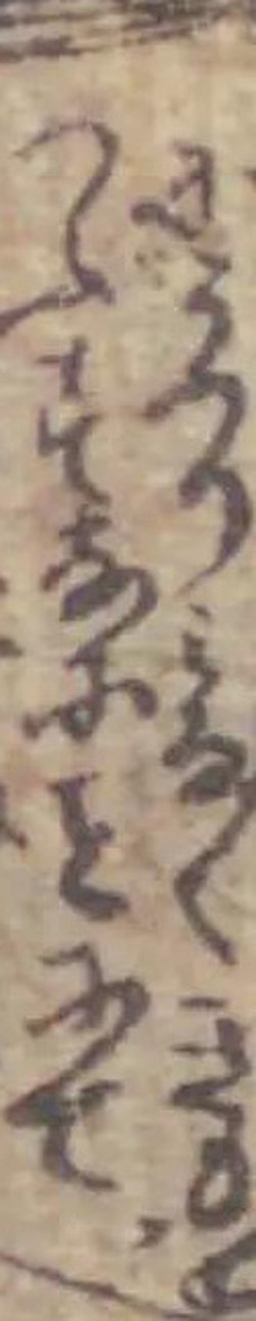つふすなにことにて
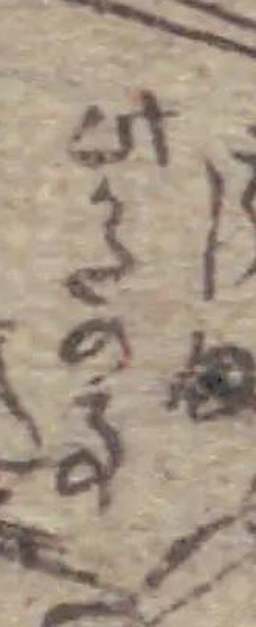此かたの事
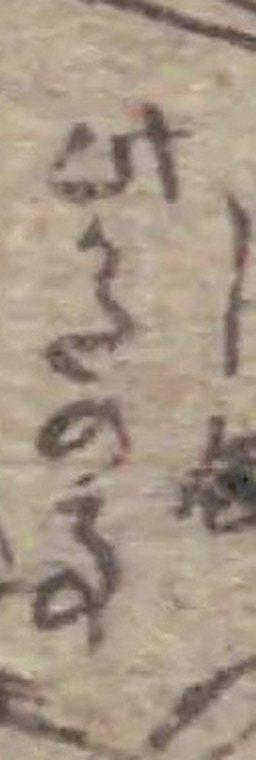此かたの事
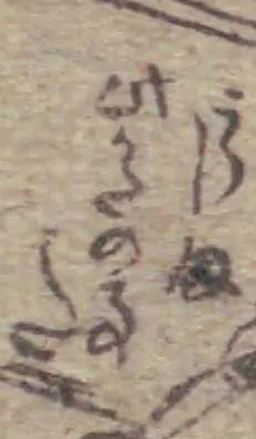此かたの事

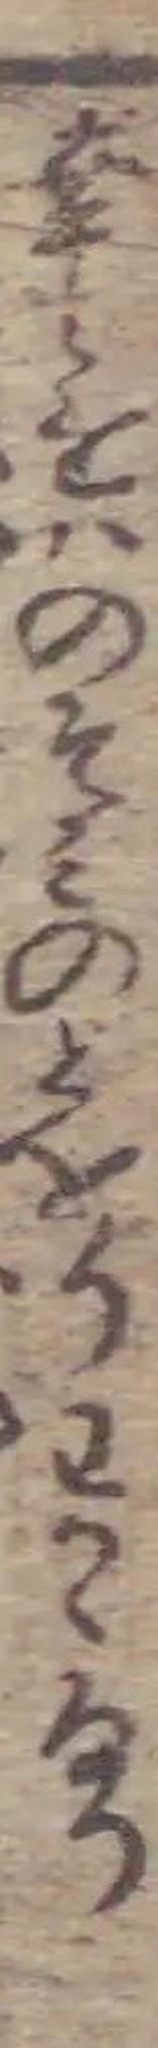幸之進はのそみのとをりわかくなり
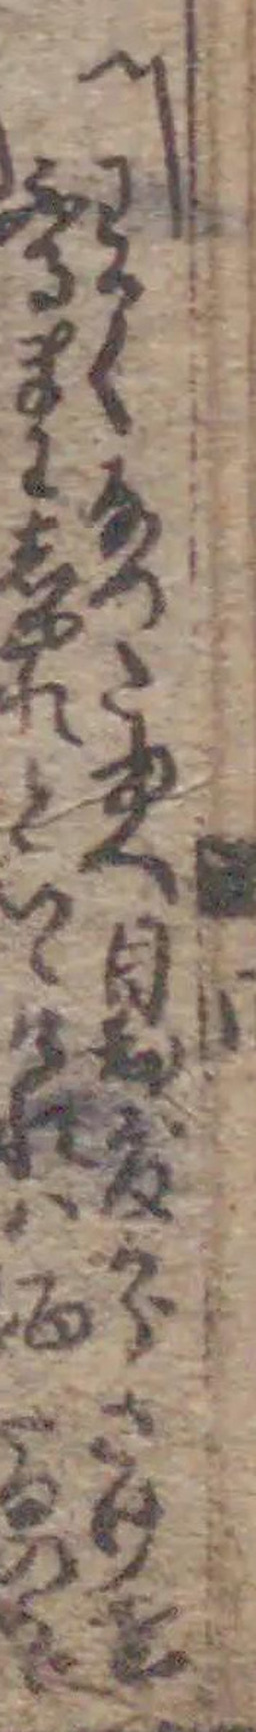「わかくなつたゆへ目出度からさけを
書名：日待御利生此ごろ噂 3巻
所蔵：国立国会図書館 National Diet Library, JAPAN
